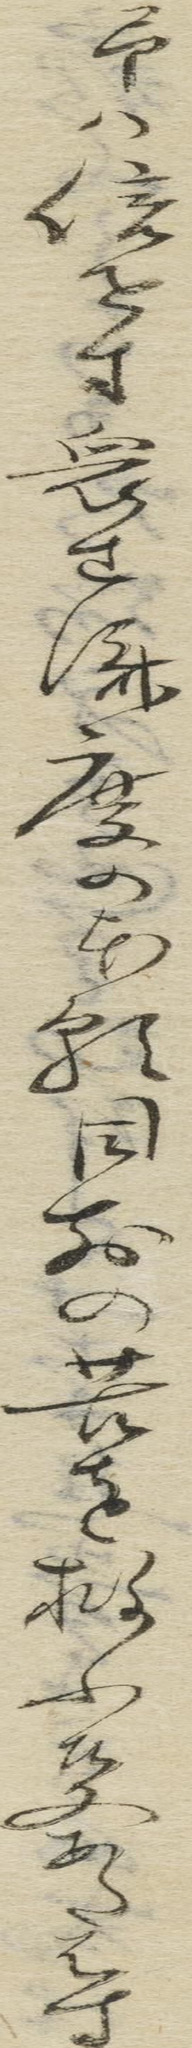予ハ信をす衆生済度の本願目前の苦を救ふ事あたはす
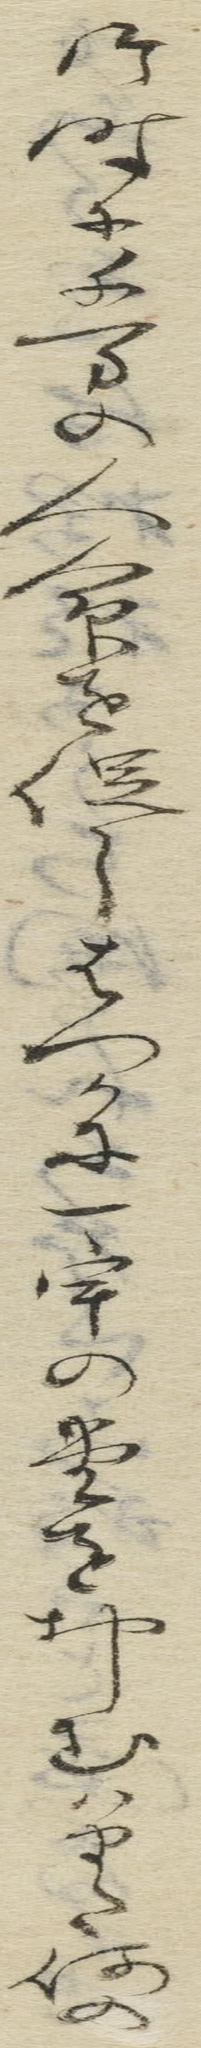御時に千万の人命を促しはつかに一宇の堂をおしむまた何の
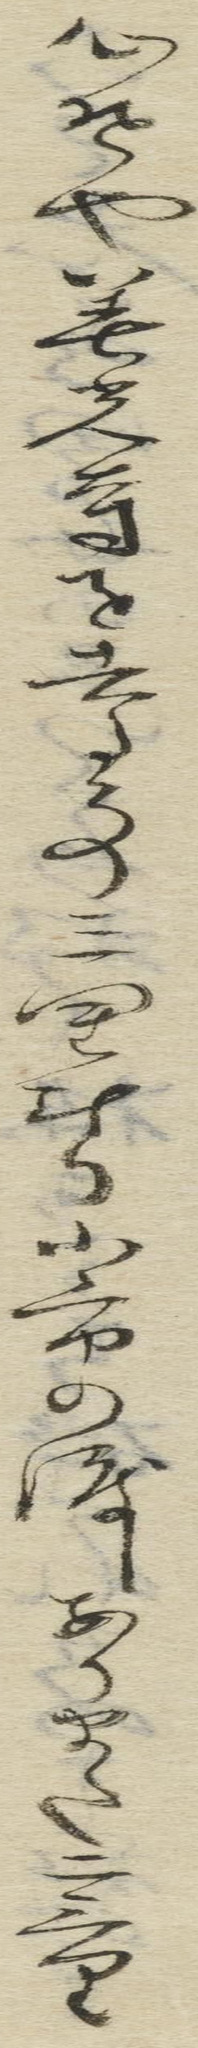心そや善光寺を去事三里計り小市の渡しありまた二三里
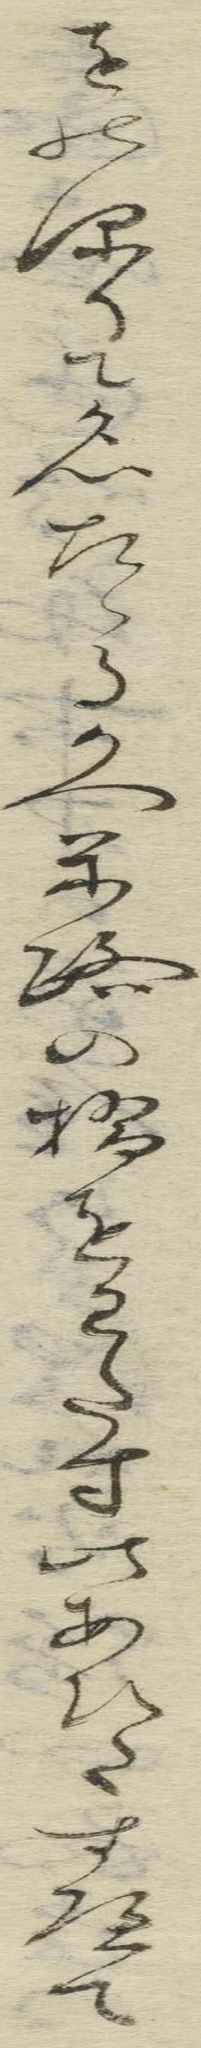をのほりて名たゝる久米路の橋をわたす此あひたすへて
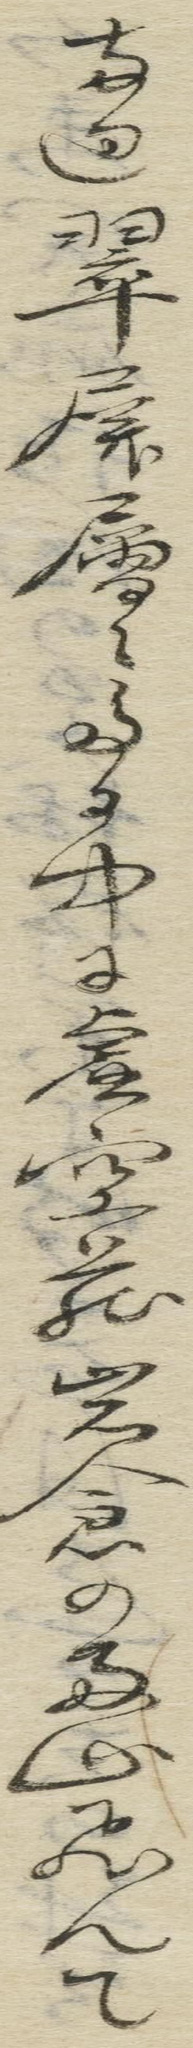両辺翠屏層したる中に虚空蔵岩倉の両山飛んて
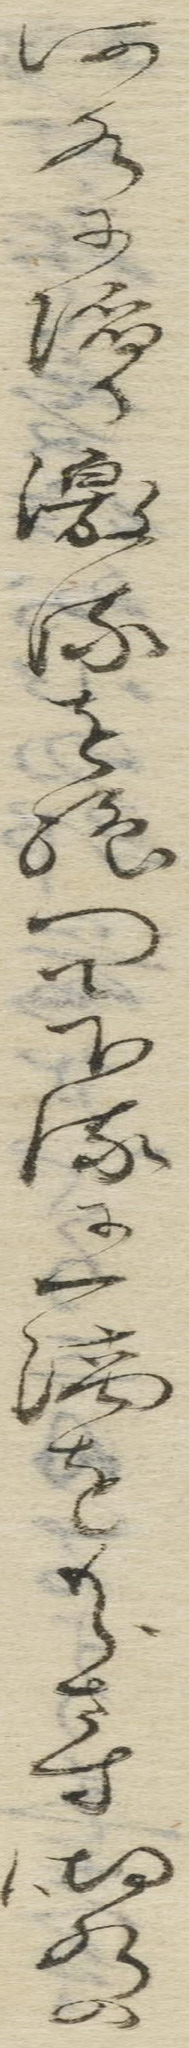河水に陥り激流を絶つて下流に一滴をもらさす湖水の
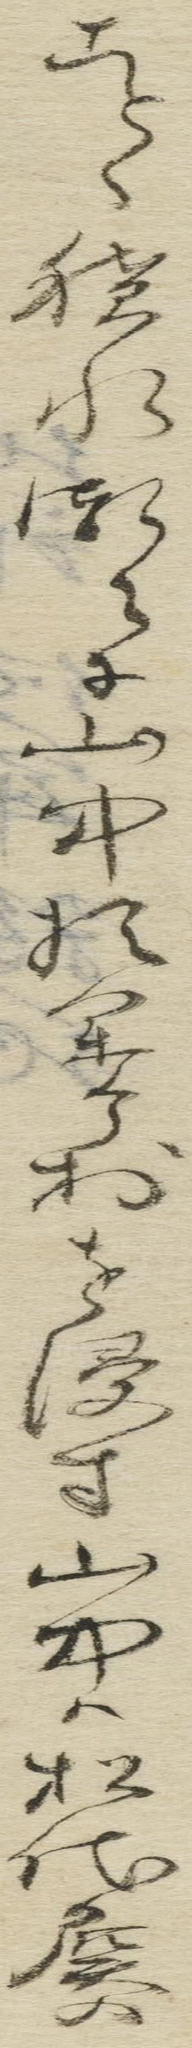ことく積水漸々に山中拾参ヶ村を浸す山中ハ松代矦の
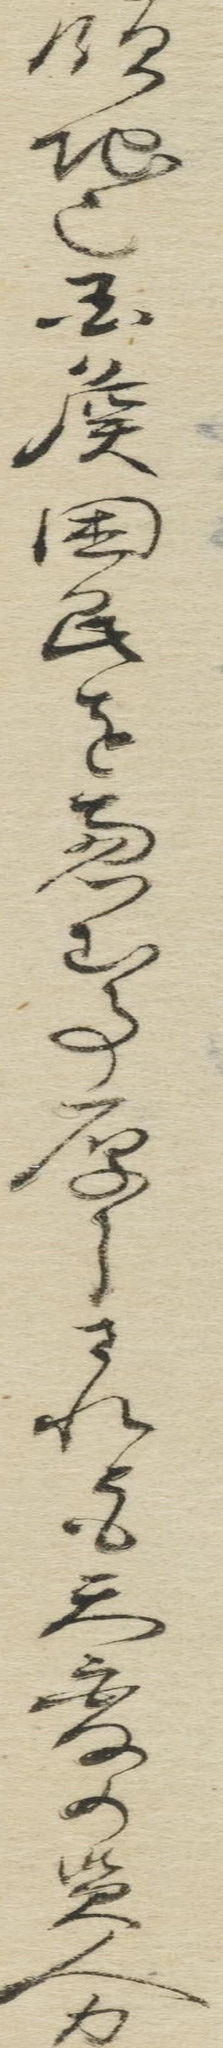領地也国矦困民を恵む事厚しされとも天変の災人力
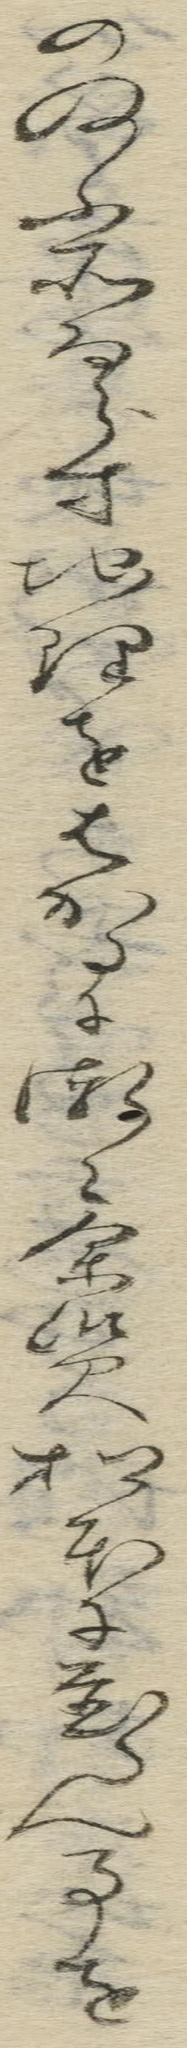の給ふ所ならす地理をはかるに漸々余災松本に至らん事を
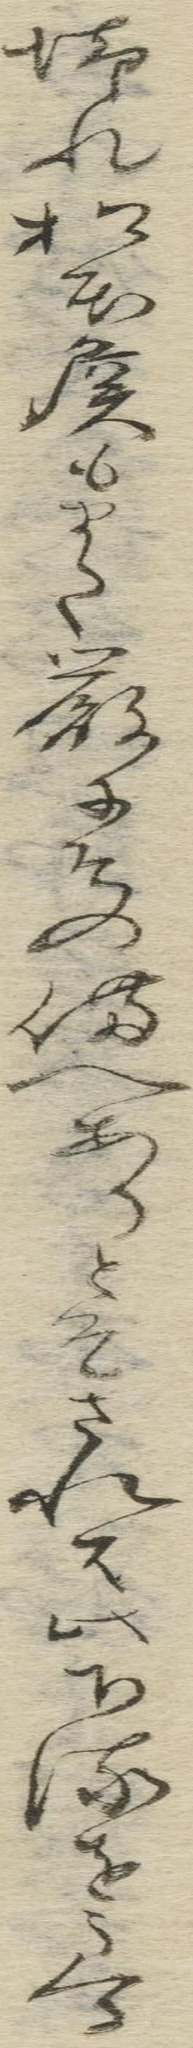怖れ松本矦もまた厳にその備へありとそ此下流をうくる
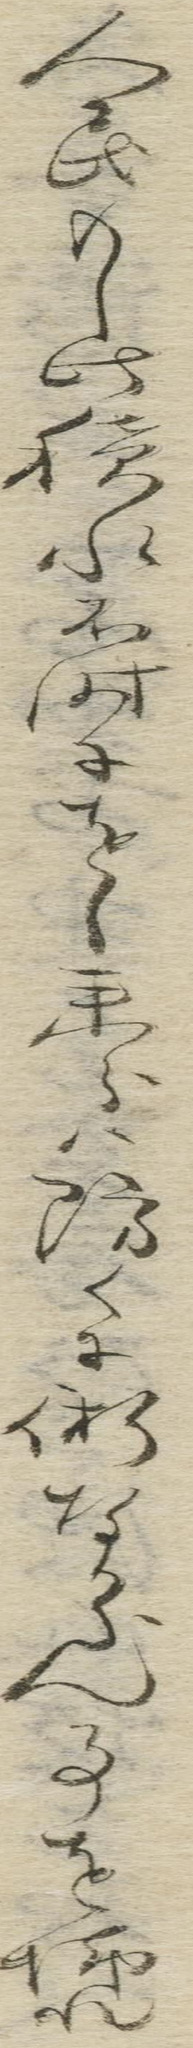人民も此積水不時にをし参らハ防くに術なからん事を怖れ
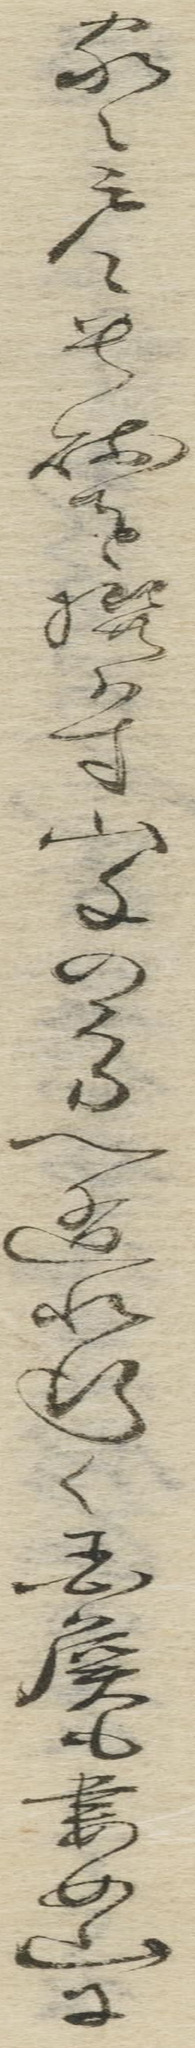家々戸々貴賤を選ハす山手の方へ遁れ行く国矦も妻女山に
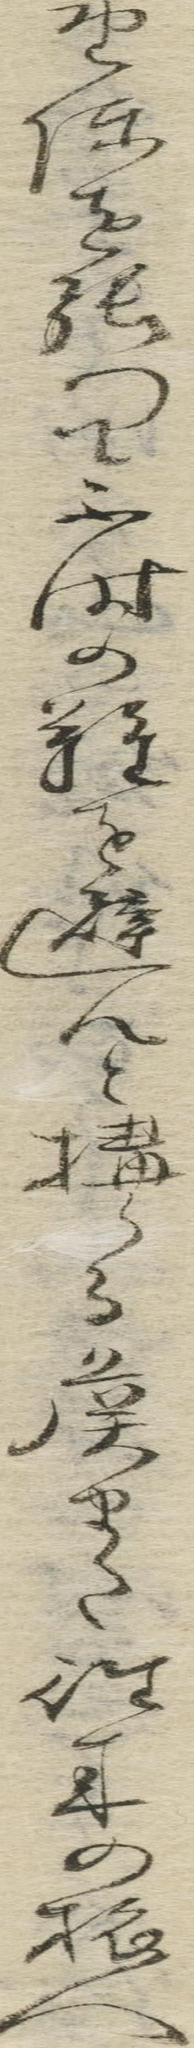野陣を張つて不時の難を避んと構らる矦また往来の旅人
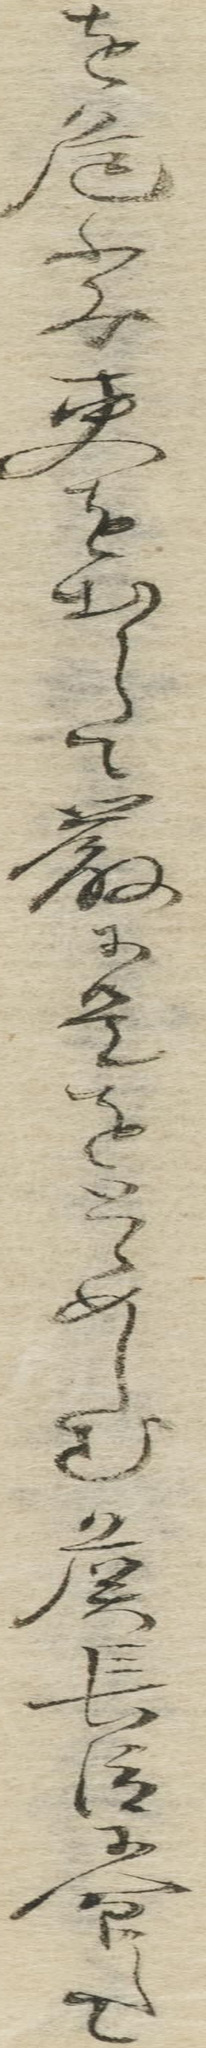を危ふみ吏を出して厳に是をとめしむ矦長臣に命して
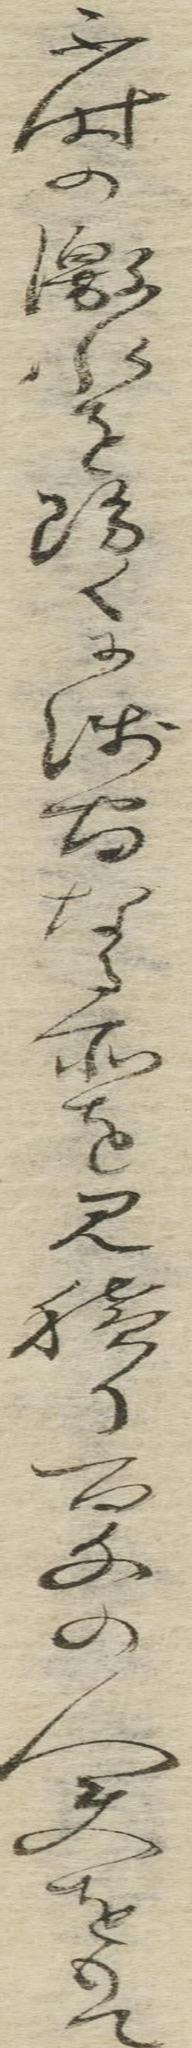不時の激水を防くに残間なる所を見積り百千の人夫をもて
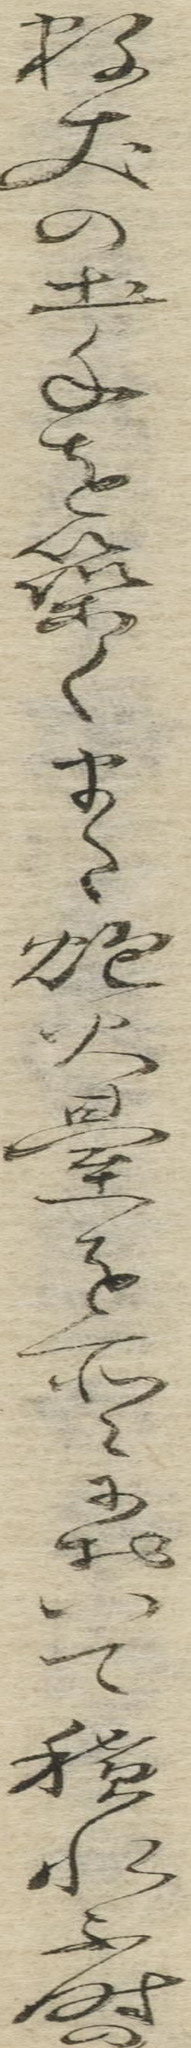数丈の土手を築くまた炮火台を所々において積水不時の
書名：弘化丁未天變日記
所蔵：東京大学地震研究所図書室 Earthquake Research Institute Library, The University of Tokyo, JAPAN
